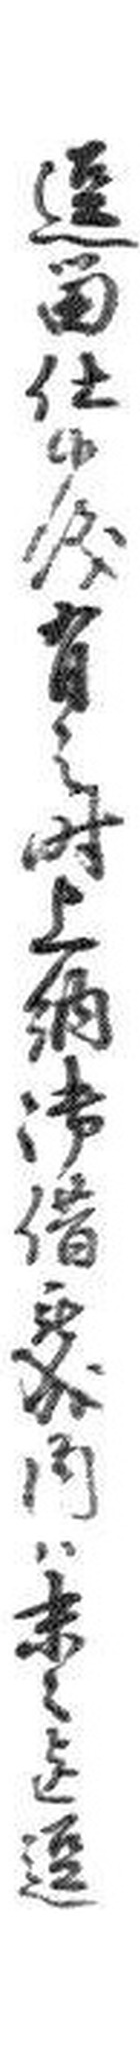逗留仕候儀有之時上納御借被成内ハ末々迄逗
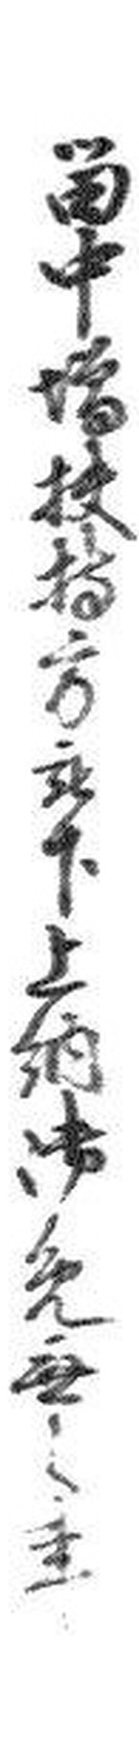留中増扶持方被下上納御免無之事
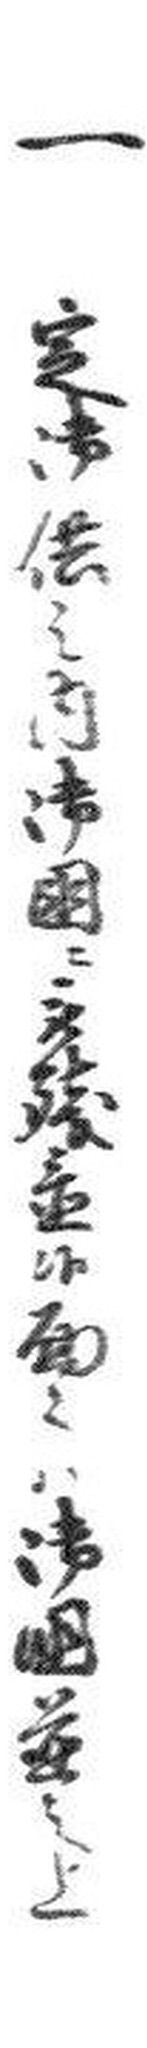一定御供之内御国ニ被残置候面々ハ御国並之上

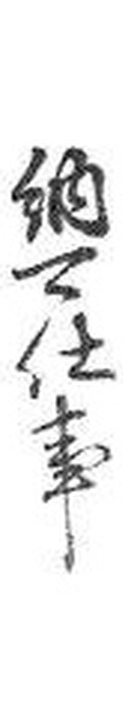納可仕事
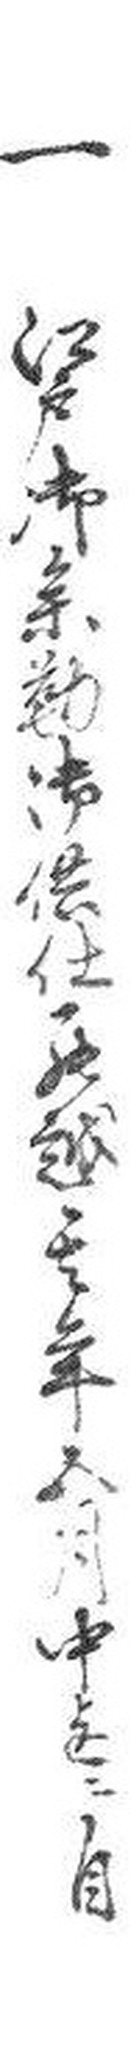一江戸御参勤御供仕罷越其年五月中迄ニ自
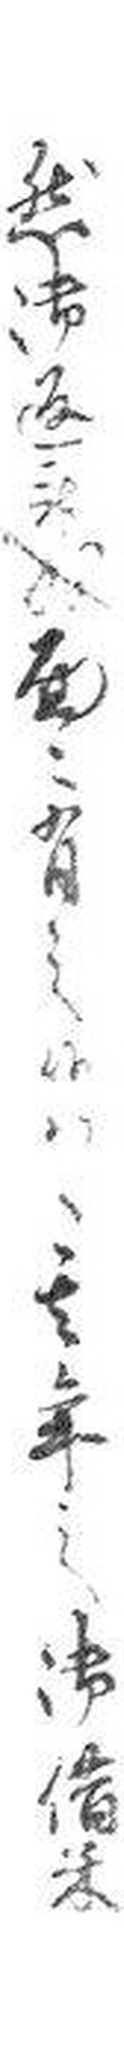然御返被成面々有之候ハヽ其年之御借米
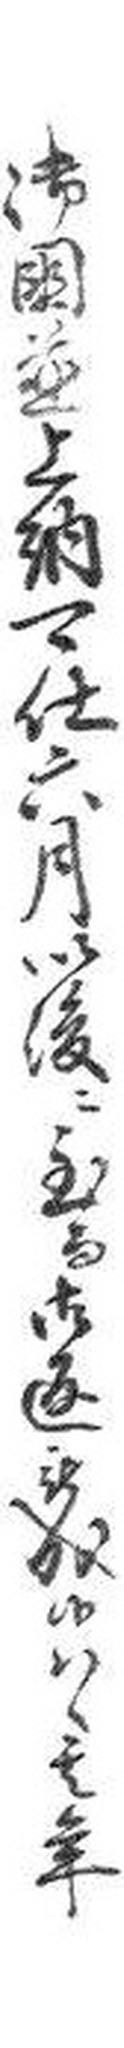御国並上納可仕六月以後ニ至而御返被成候ハヽ其年
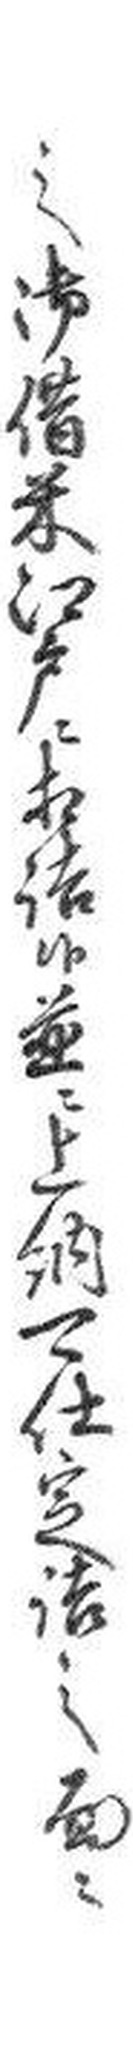之御借米江戸ニ相詰候並ニ上納可仕定詰之面々
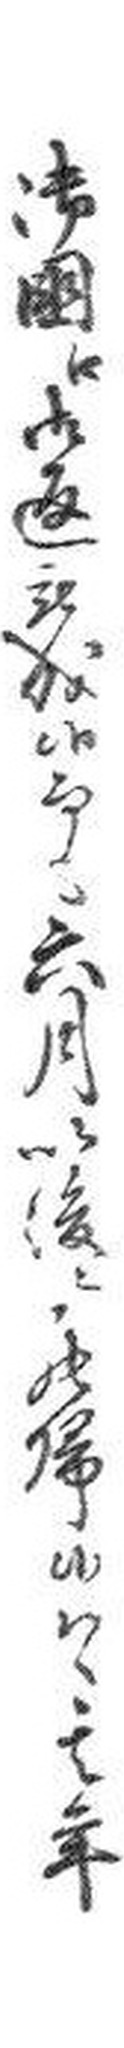御国江御返被成候而も六月以後ニ罷帰候ハヽ其年
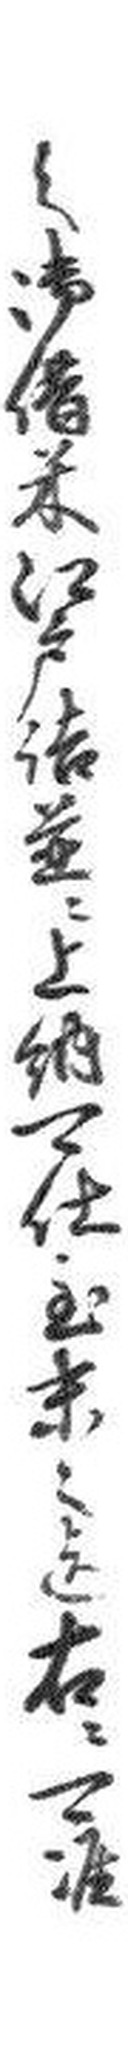之御借米江戸詰並ニ上納可仕至末々迄右ニ可准
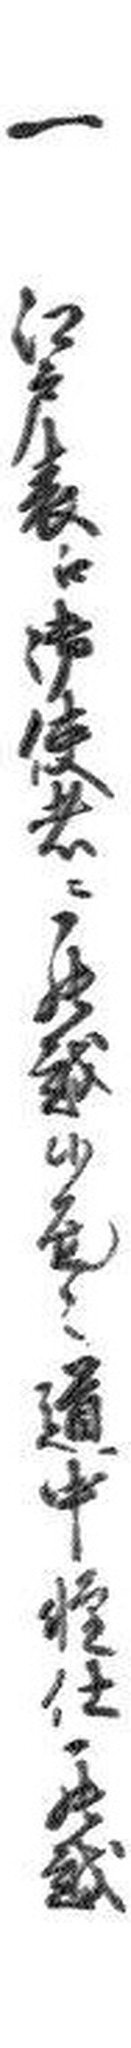一江戸表江御使者ニ罷越候面々道中軽仕罷越
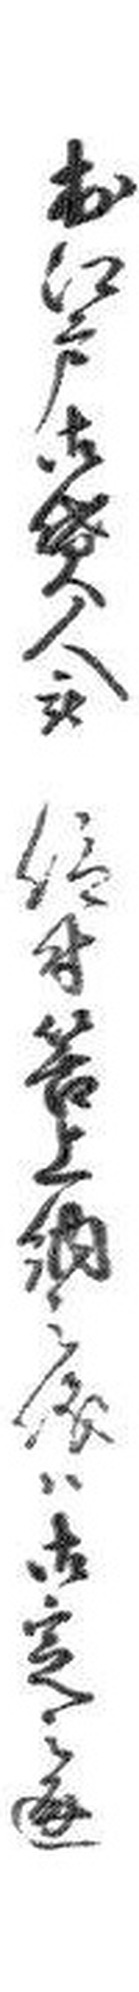於江戸御貸人被仰付筈上納之儀ハ御定之通
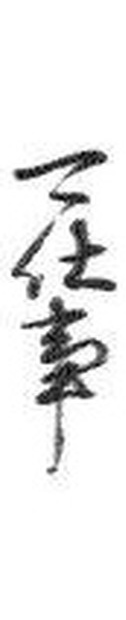可仕事
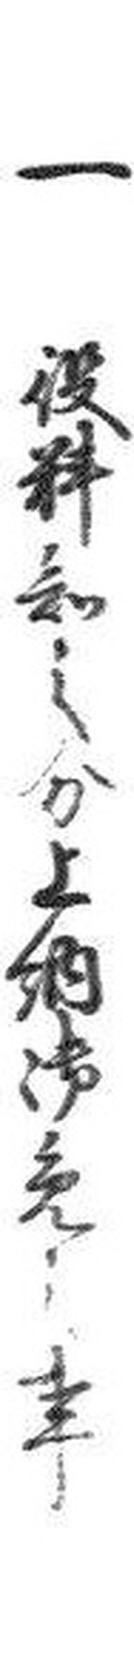一役料知之分上納御免之事
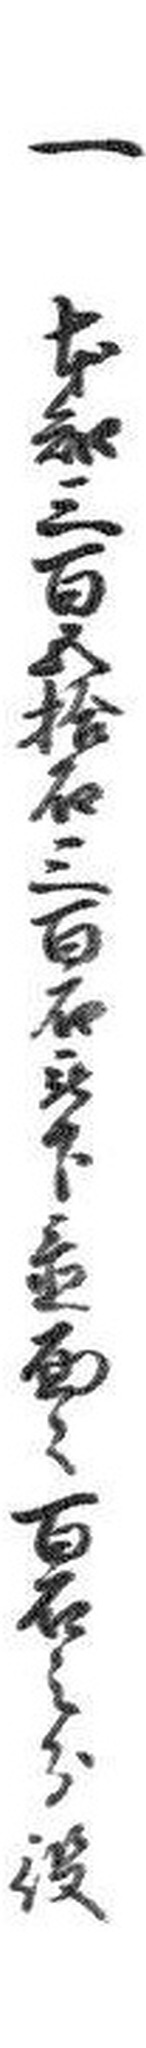一本知三百五拾石三百石被下置面々百石之分役
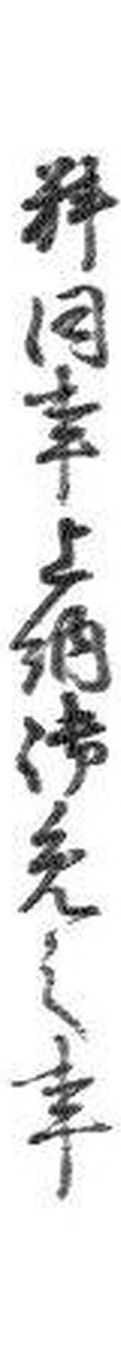料同事上納御免之事
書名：家譜 二十三 吉品公 従宝永元年到同二年
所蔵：福井県文書館 Fukui Prefectural Archives
